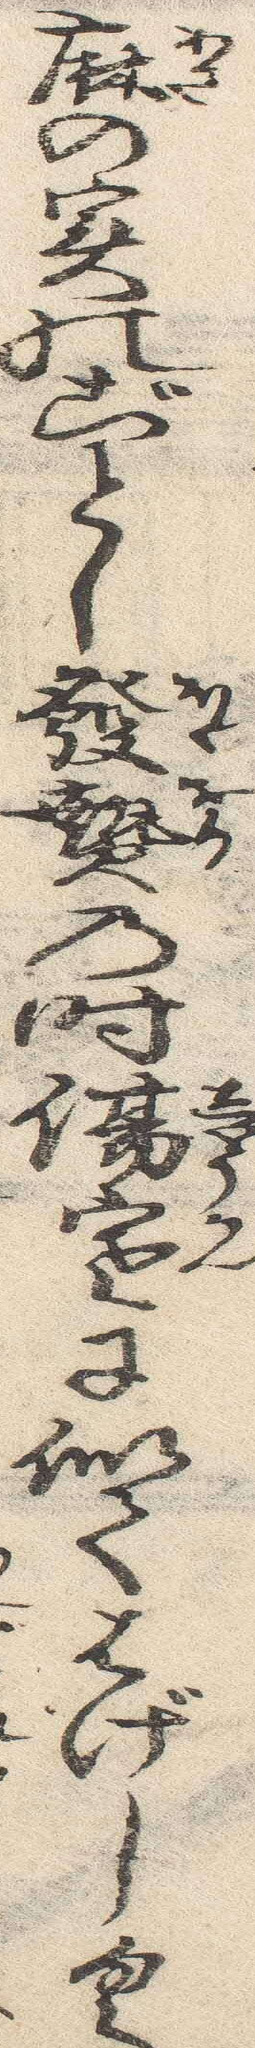麻の実のごとし発熱の時傷寒に似てはげしく
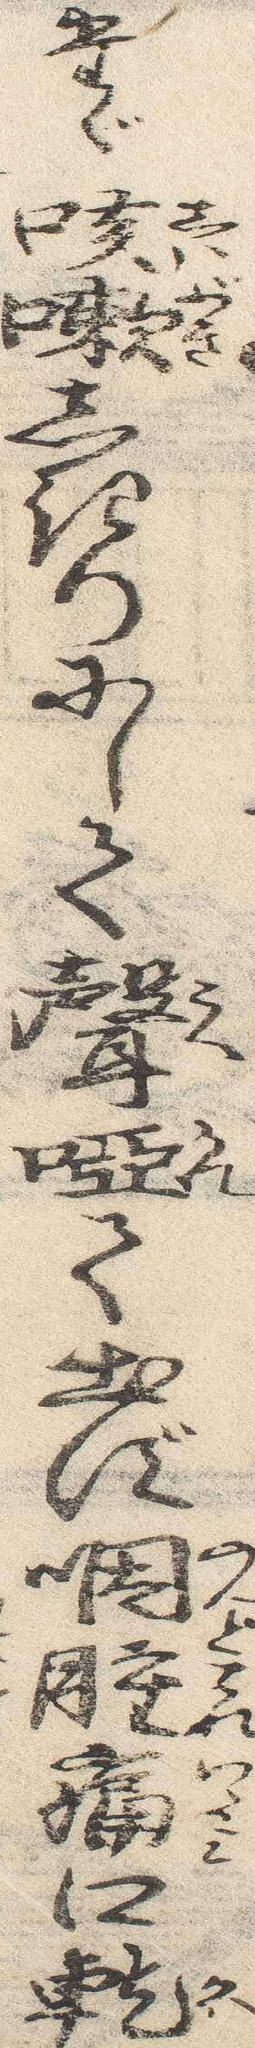たゞ咳嗽しきりにして声啞て出ず咽腫痛口乾
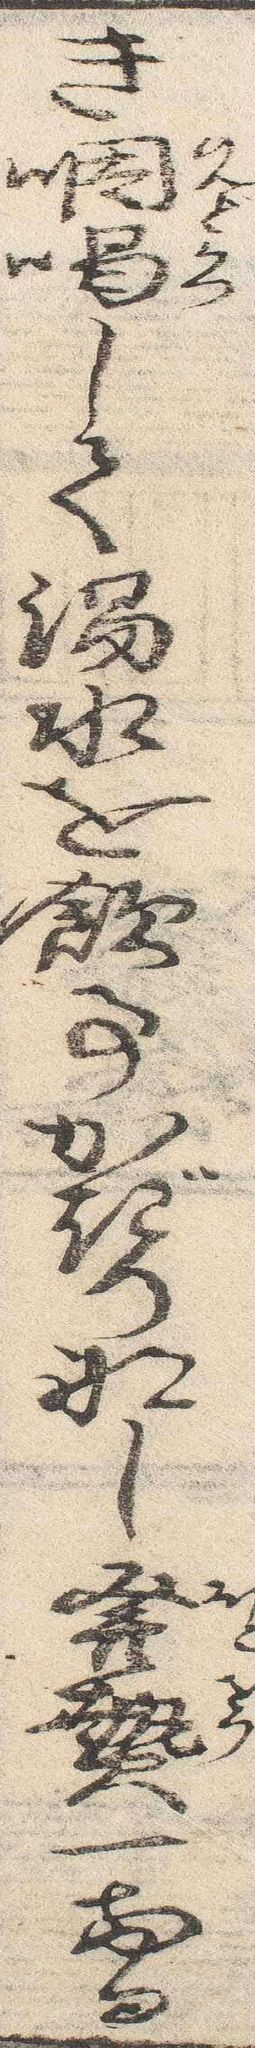き咽喝して渇水を飲事かぎりなし発熱一両日
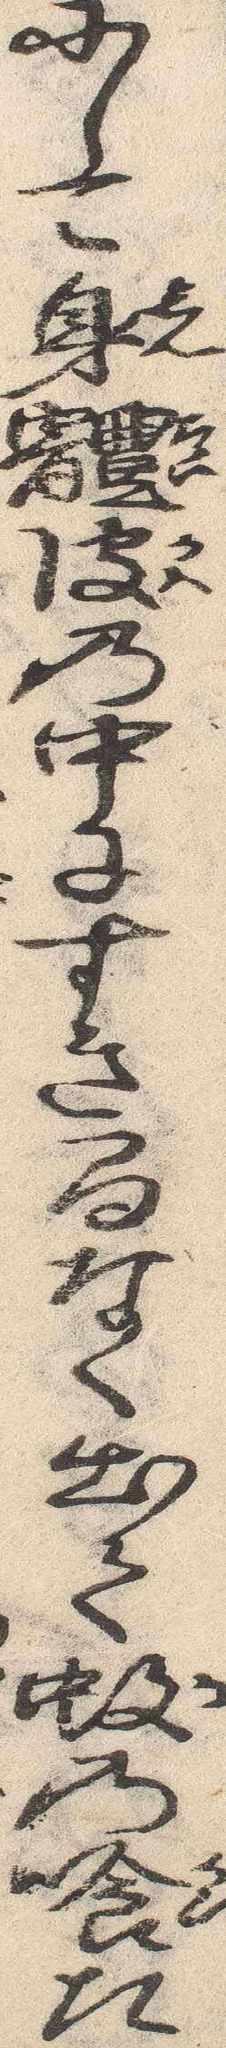にして身体皮の中にすき間なく出て蚊の喰た
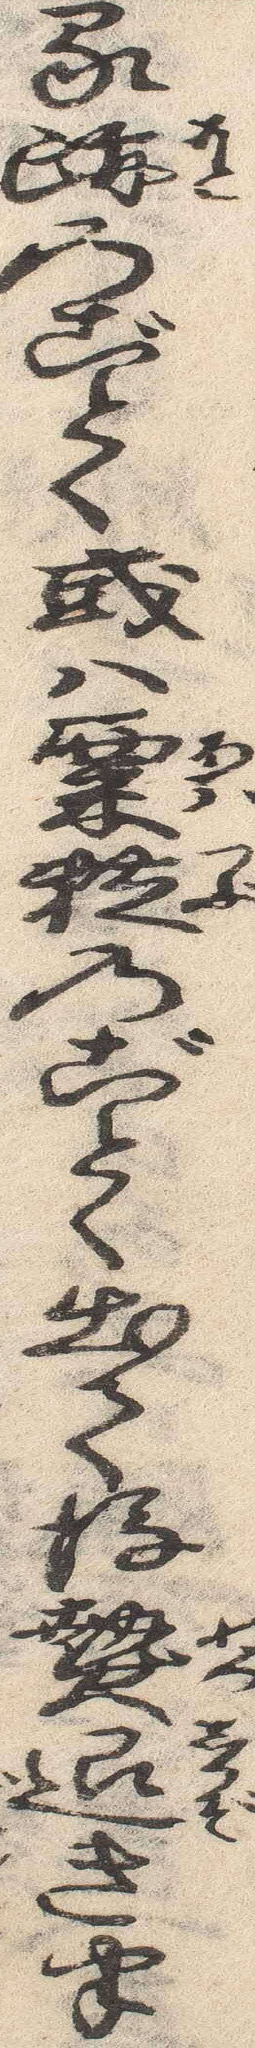る跡のごとく或は粟粒のごとく出て後熱退き半
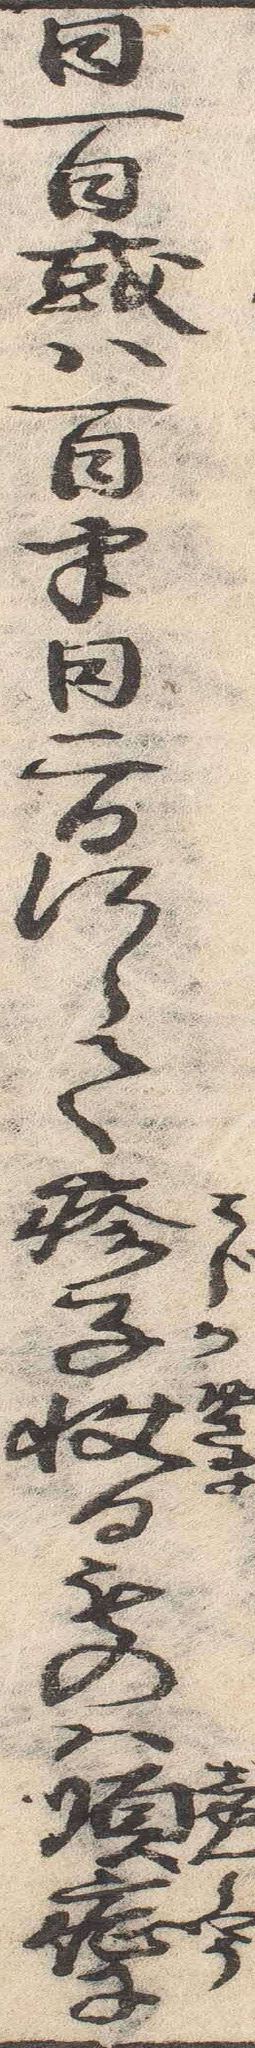日一日或は一日半日二日にして疹子収るものは順症に
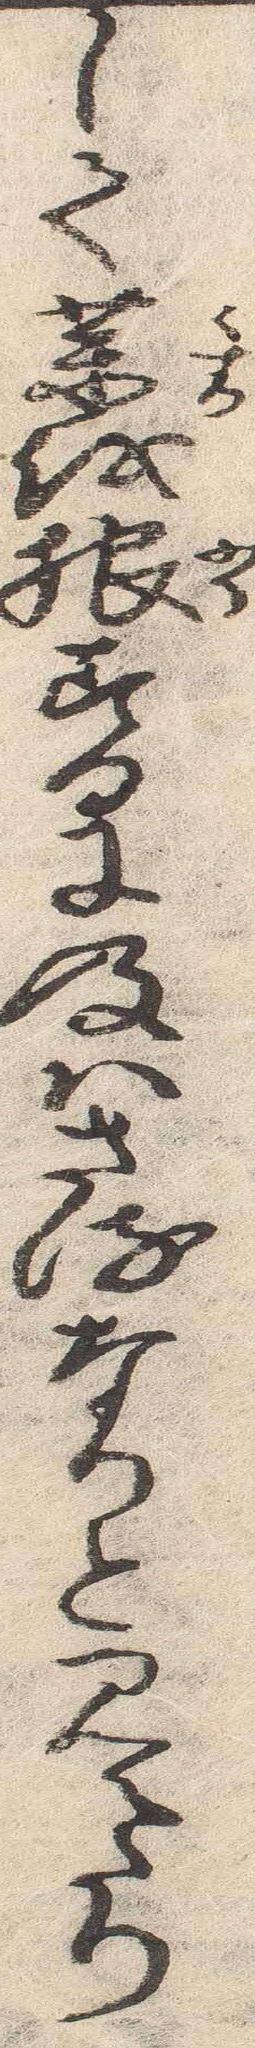して薬を服するに及はさるなりと見えたり
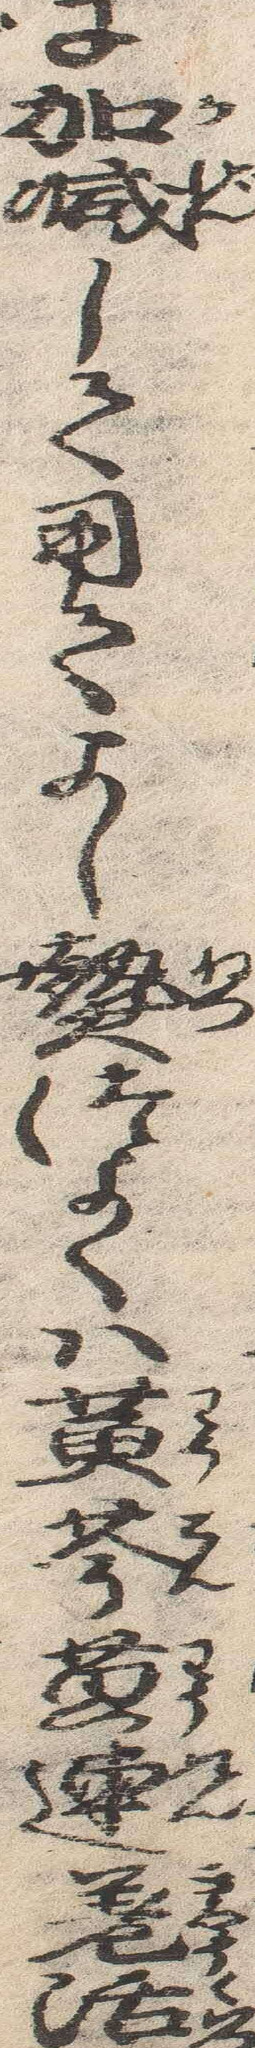に加減して用てよし熱つよくは黄芩黄連羌活
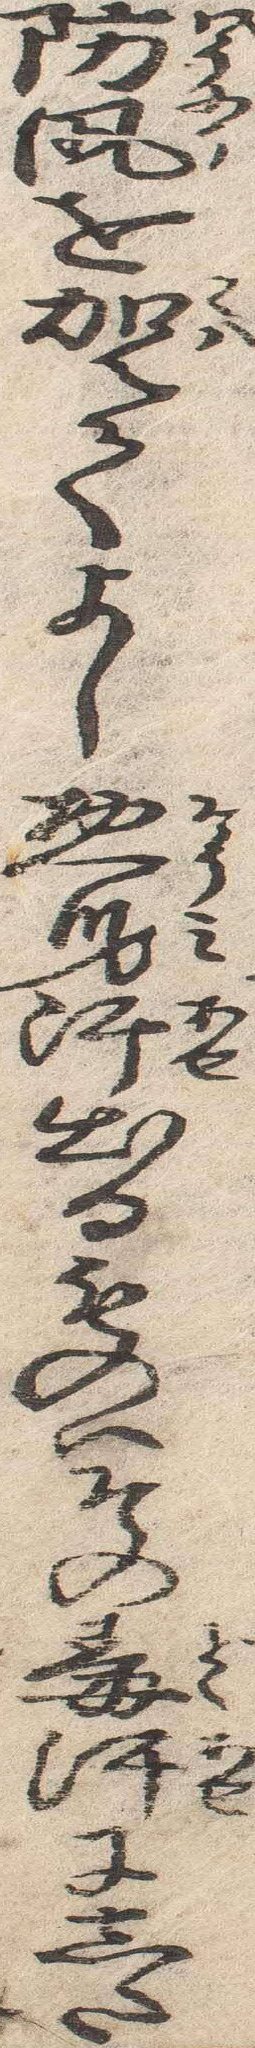防風を加えてよし総身汗出るものはその毒汗にした
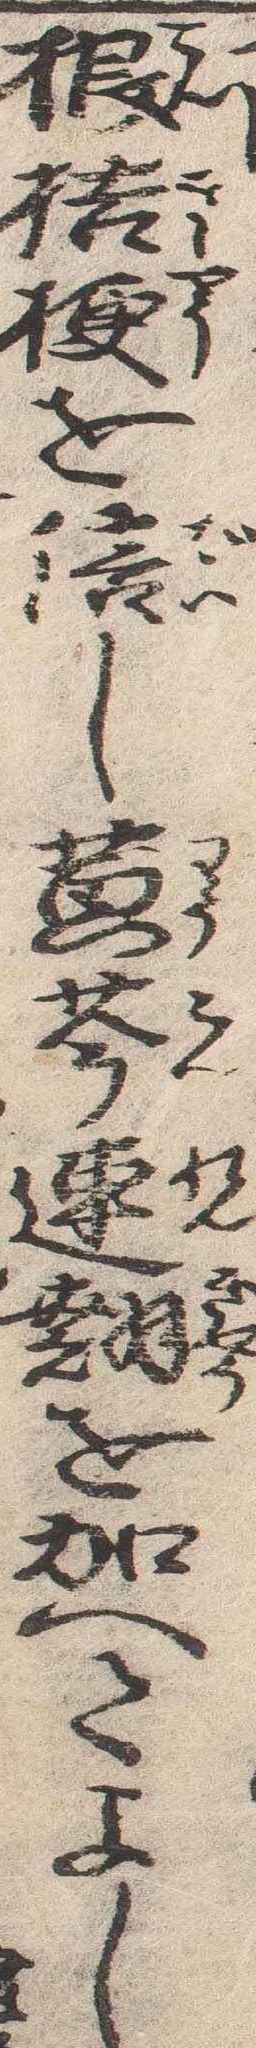根桔梗を倍し黄芩連翹を加へてよし
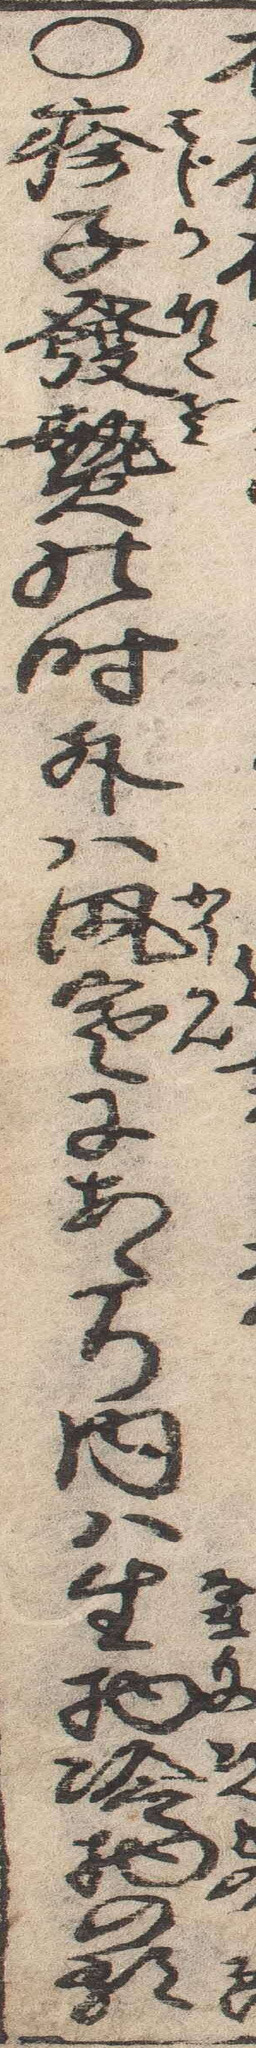○疹子発熱の時外は風寒にあたり内は生物冷物の類

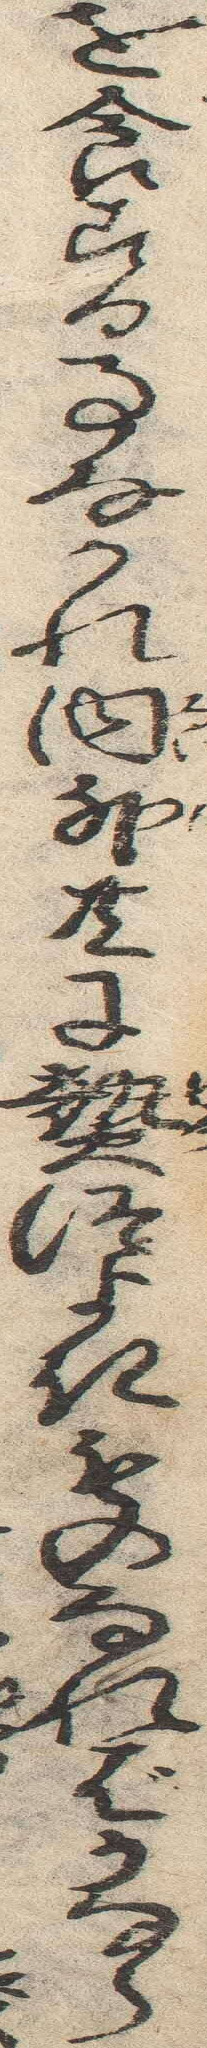を食する事なかれ内外共に熱つよきものなればかなら
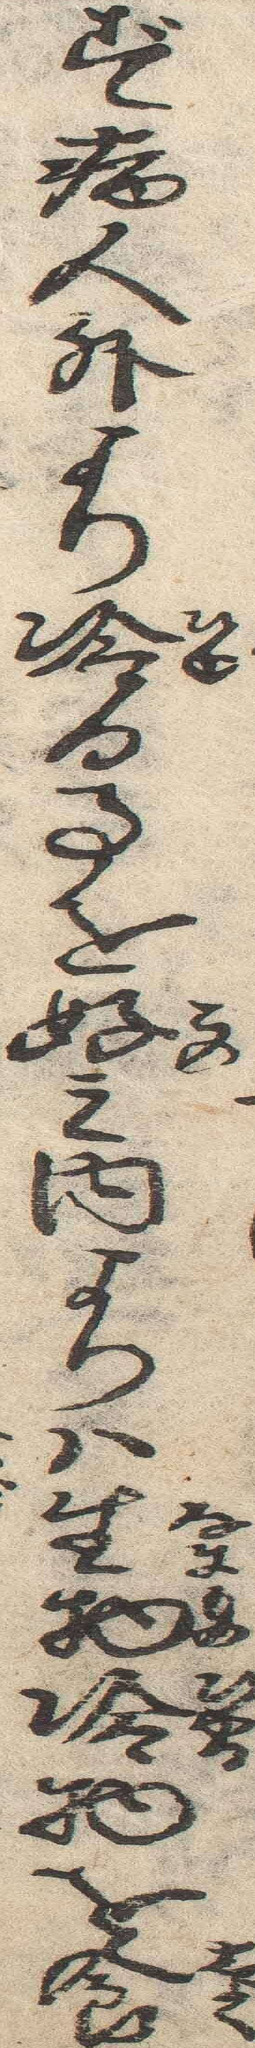ず病人外より冷る事を好み内よりは生物冷物を食
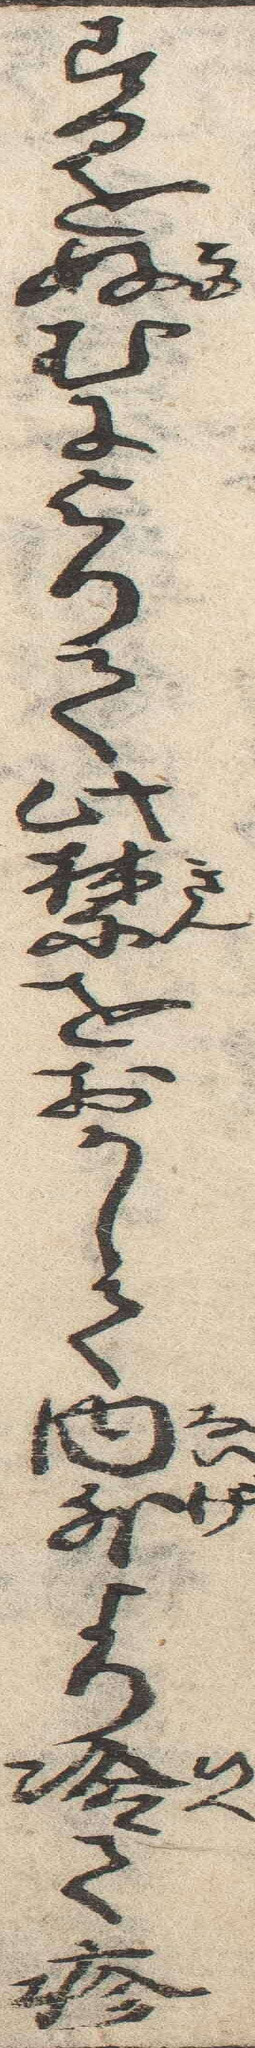するを好むによりて此禁をおかして内外より冷て疹
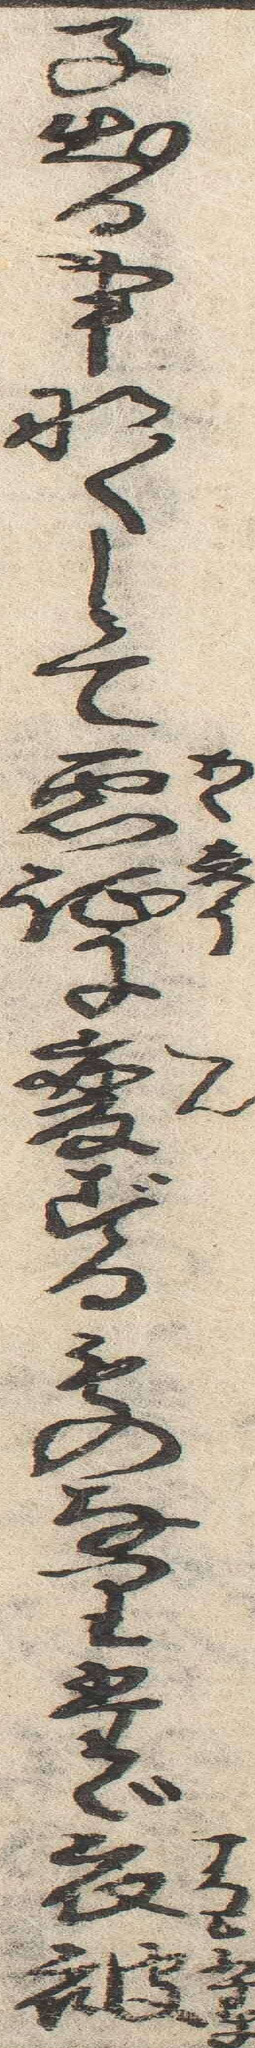子出る事なくして悪証に変ずるものなりたゞ衣被
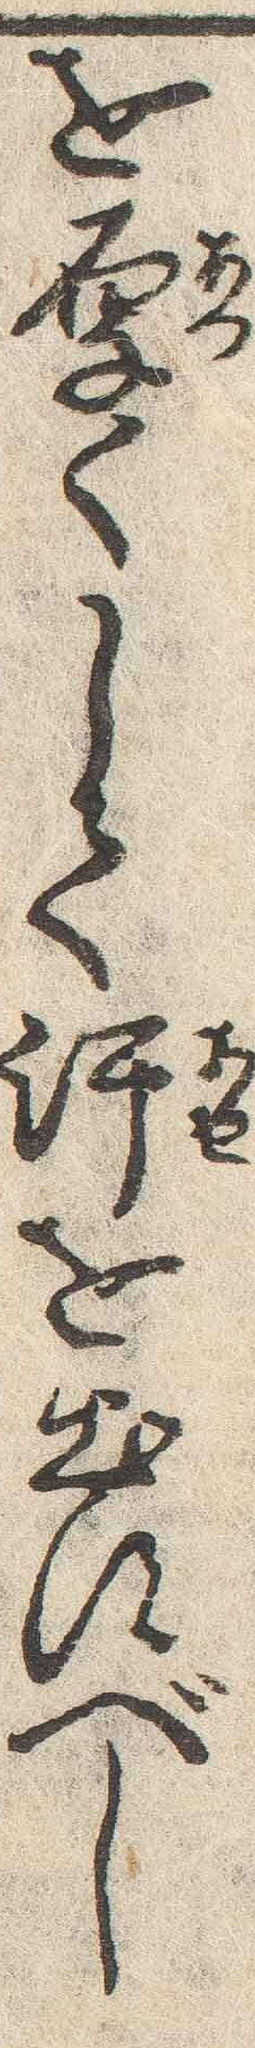を厚くして汗を出すべし
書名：小児必用養育草
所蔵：東京学芸大学附属図書館 国文学研究資料館
